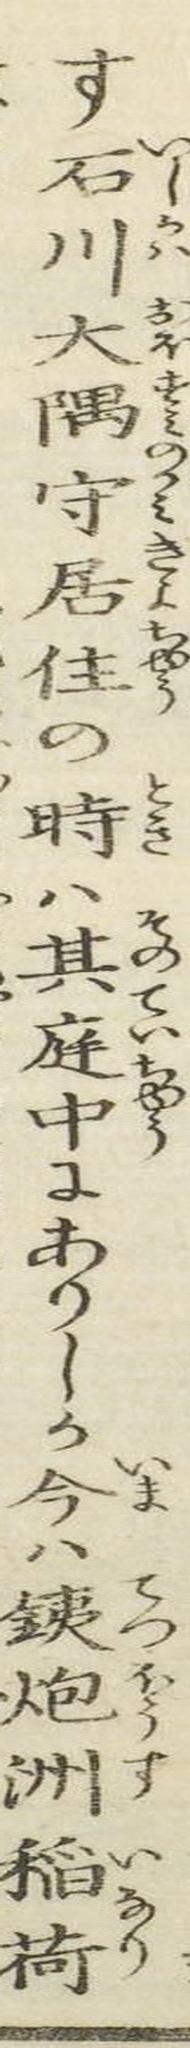す石川大隅守居住の時は其庭中にありしか今は鉄炮洲稲荷
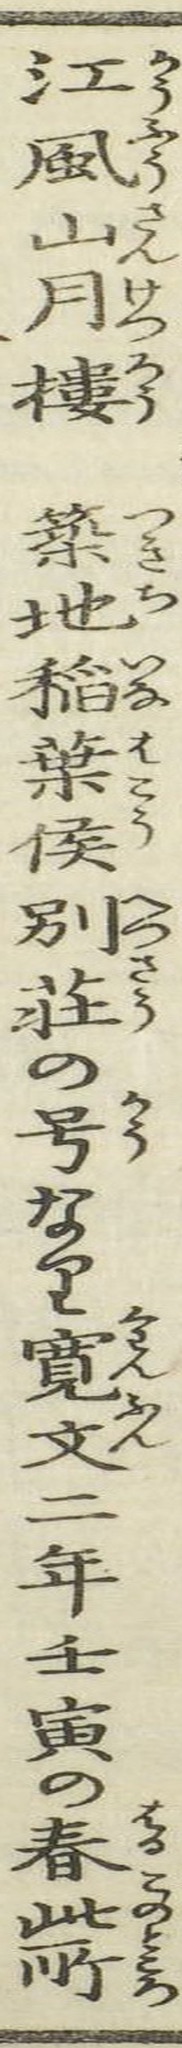江風山月楼築地稲葉侯別荘の号なり寛文二年壬寅の春此所
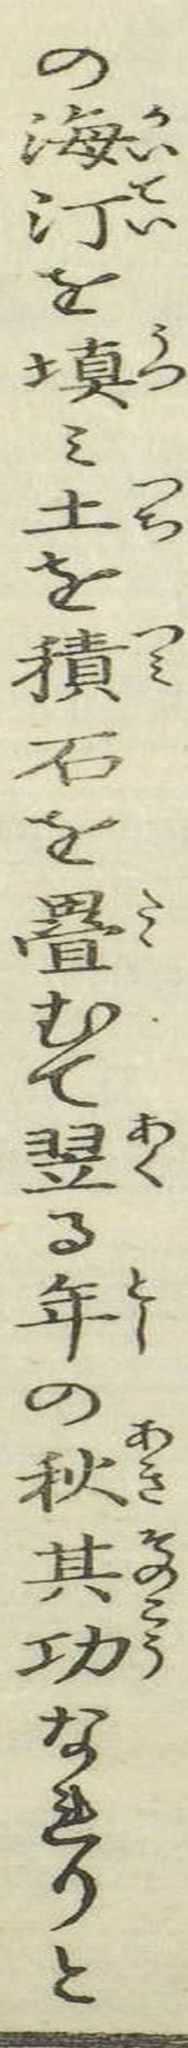の海汀を塡み土を積石を畳むて翌る年の秋其功なれりと
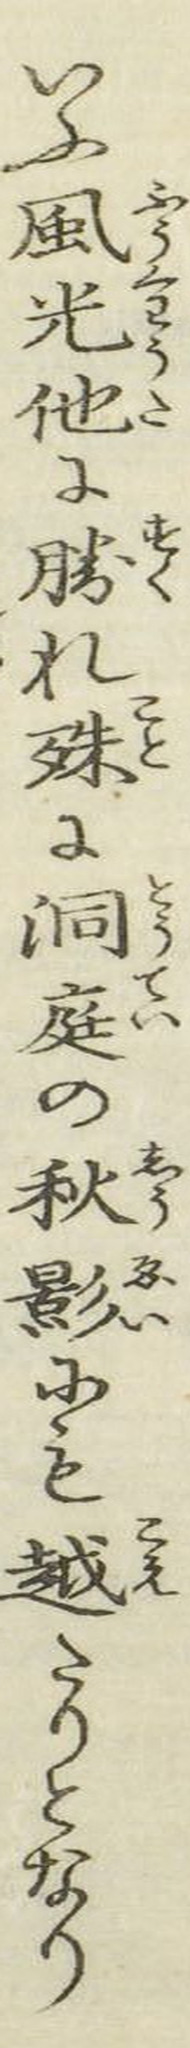いふ風光他に勝れ殊に洞庭の秋影にも越たりとなり

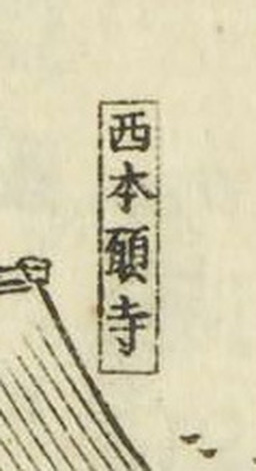西本願寺
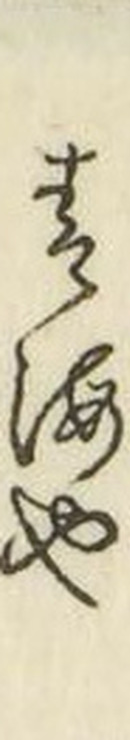青海や
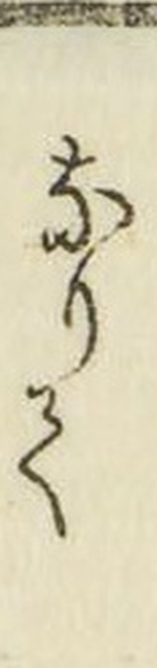なりて

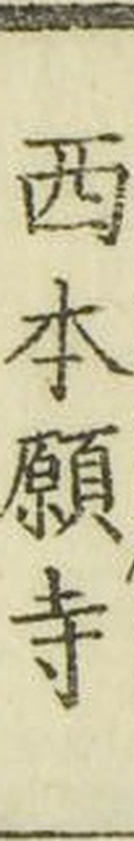西本願寺
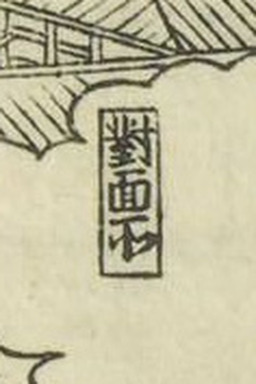対面所

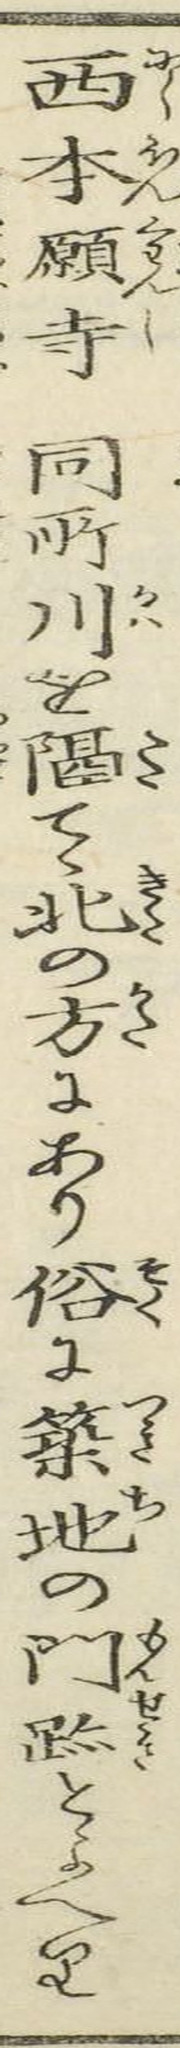西本願寺同所川を隔てゝ北の方にあり俗に築地の門跡とよへり
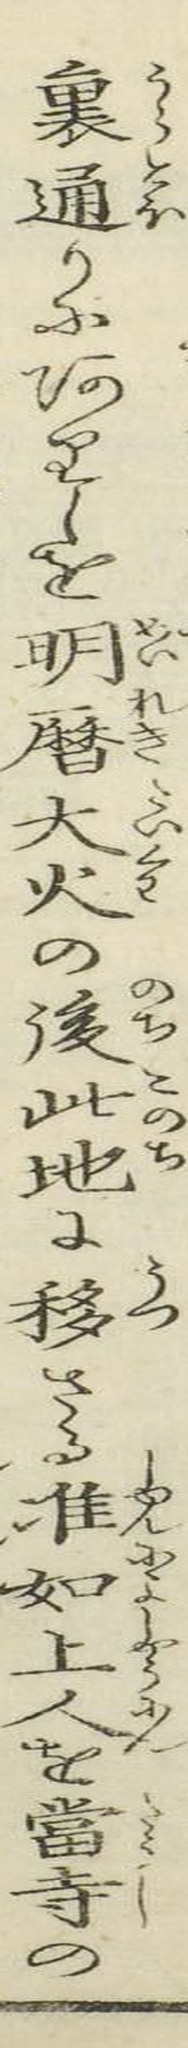裏通りにありしを明暦大火の後此地に移さる准如上人を當寺の
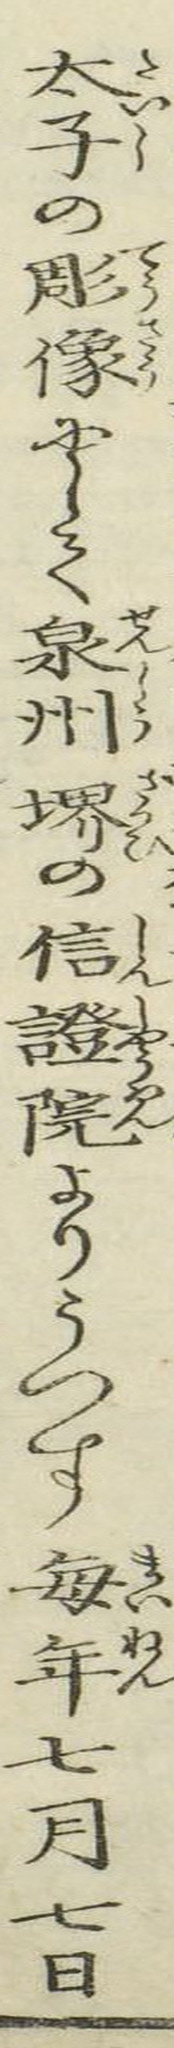太子の彫像にして泉州堺の信證院よりうつす毎年七月七日
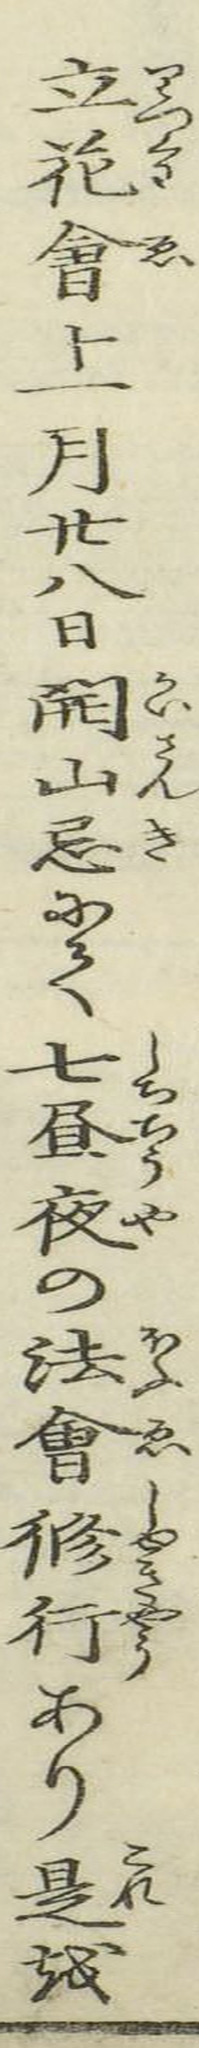立花會十一月廿八日開山忌にて七昼夜の法會修行あり是を
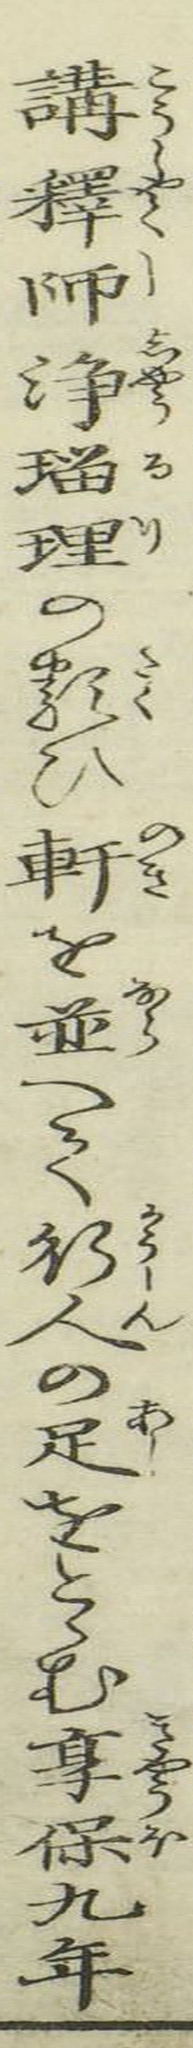講釈師浄瑠璃の類ひ軒を並へて行人の足をとゝむ享保九年
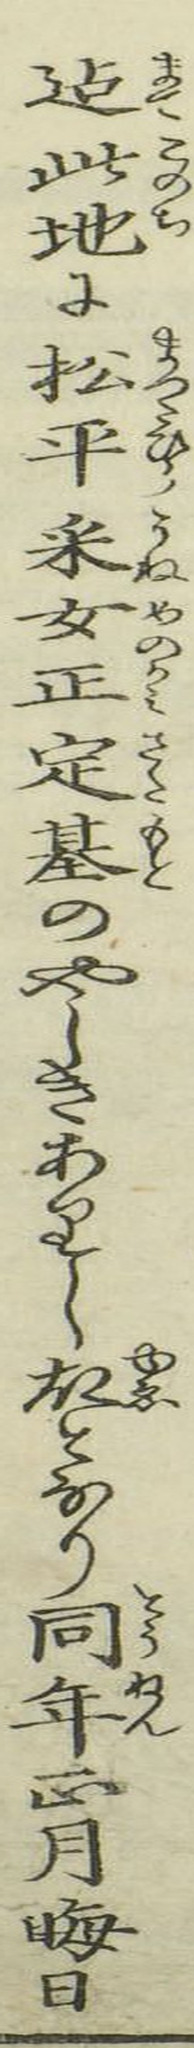迄此地に松平采女正定基のやしきありし故となり同年正月晦日

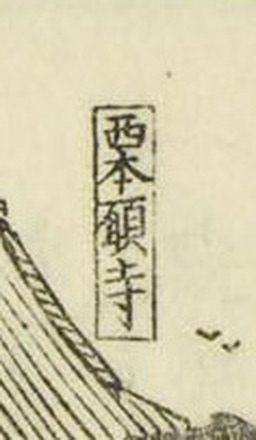西本願寺
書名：江戸名所図会 20巻 巻之2
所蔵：東京学芸大学教育コンテンツアーカイブ
